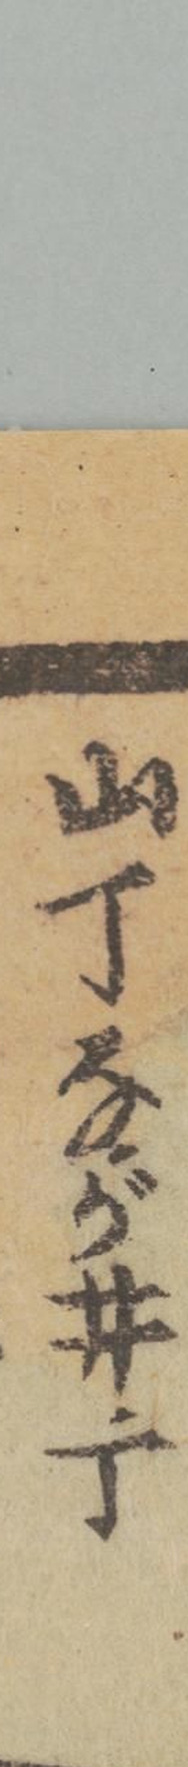山丁なが井丁
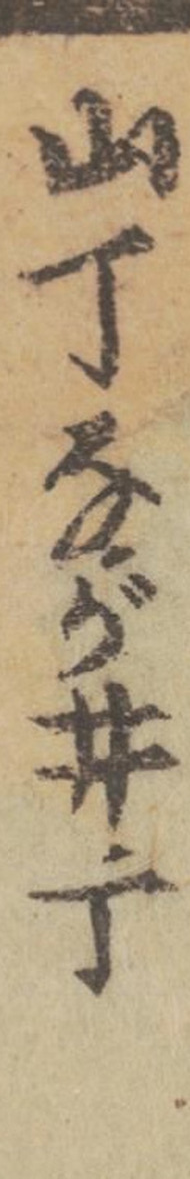山丁なが井丁
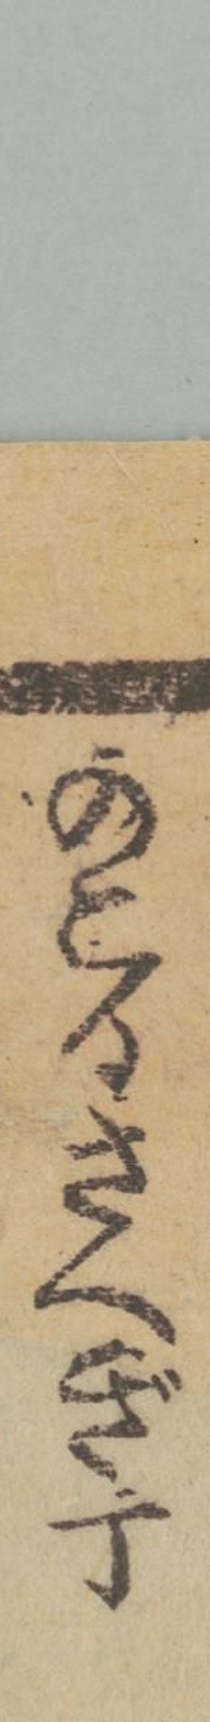のこるさへぎ丁
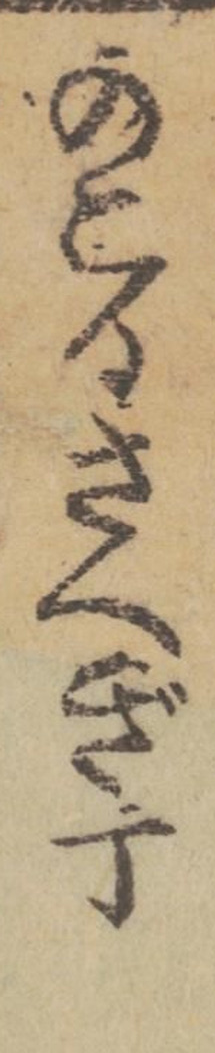のこるさへぎ丁
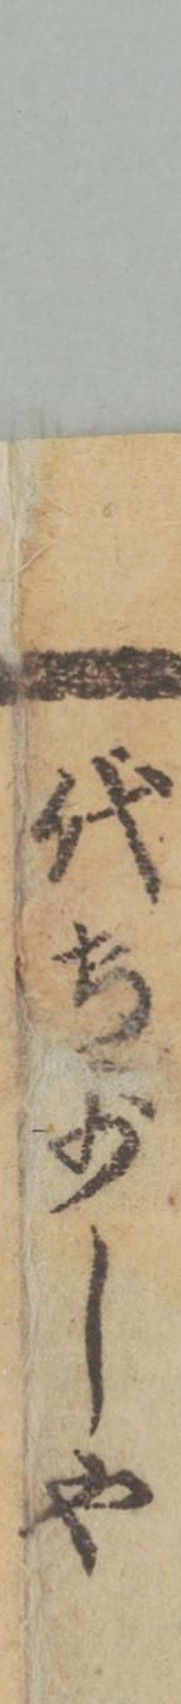代ち少しや
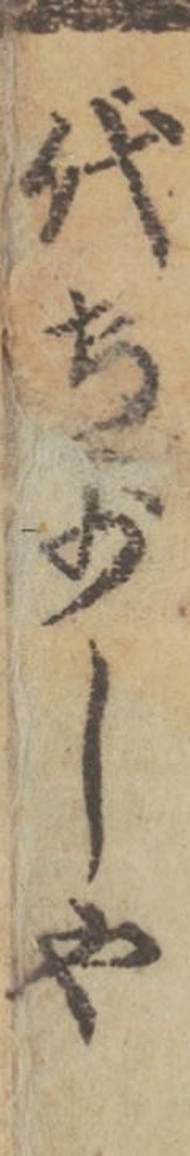代ち少しや
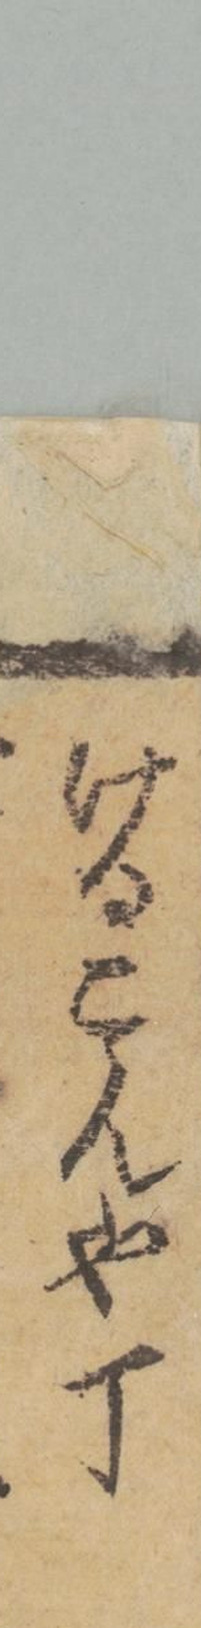けるこんや丁
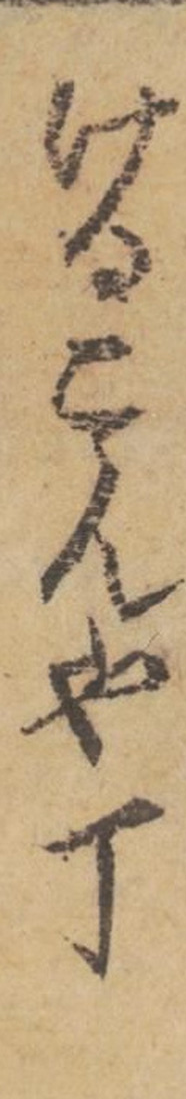けるこんや丁
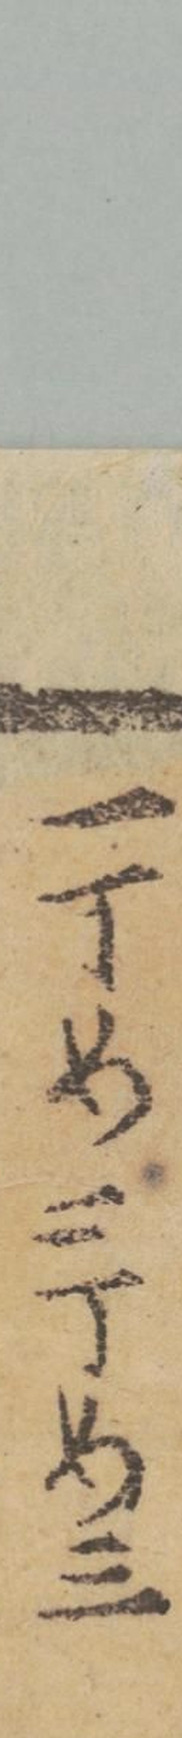一丁め二丁め三
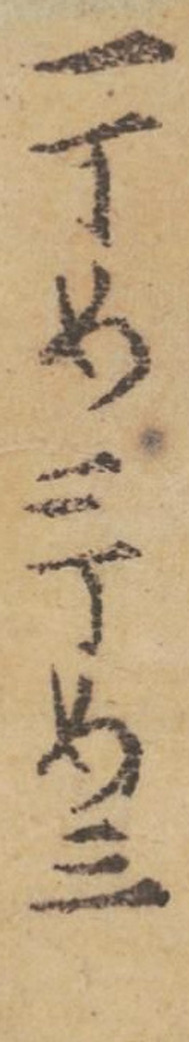一丁め二丁め三
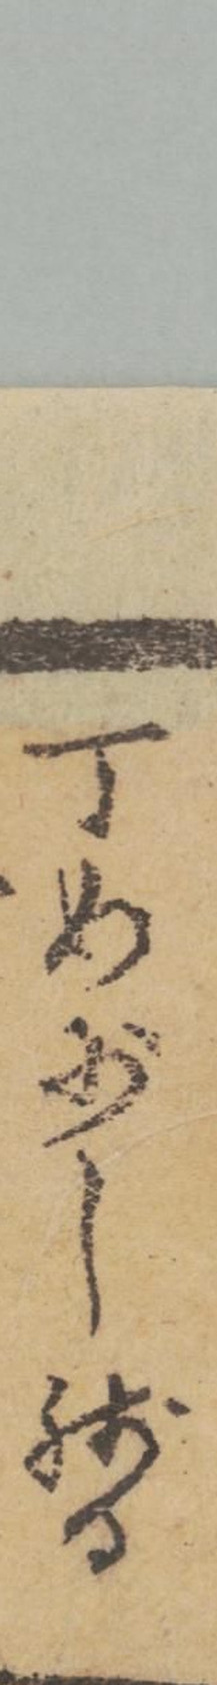丁め少し残る
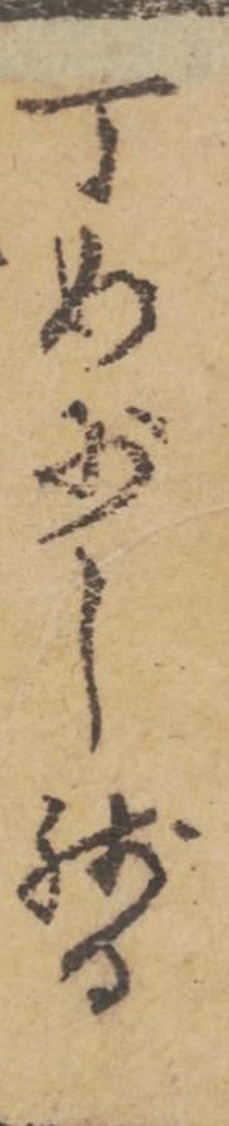丁め少し残る
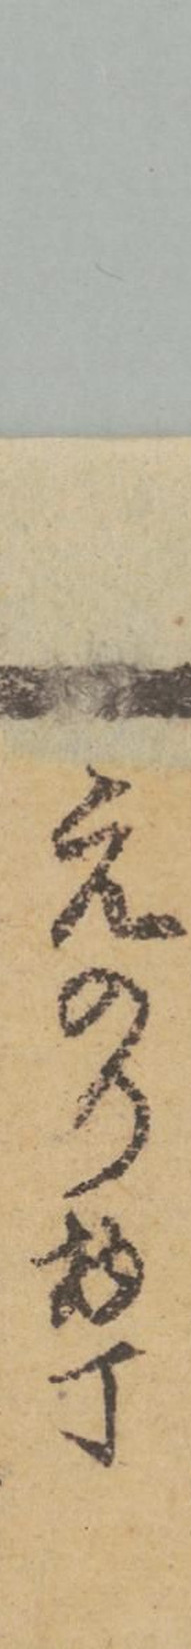元のり物丁
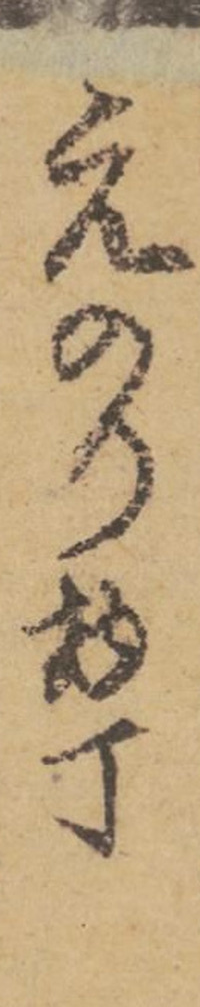元のり物丁
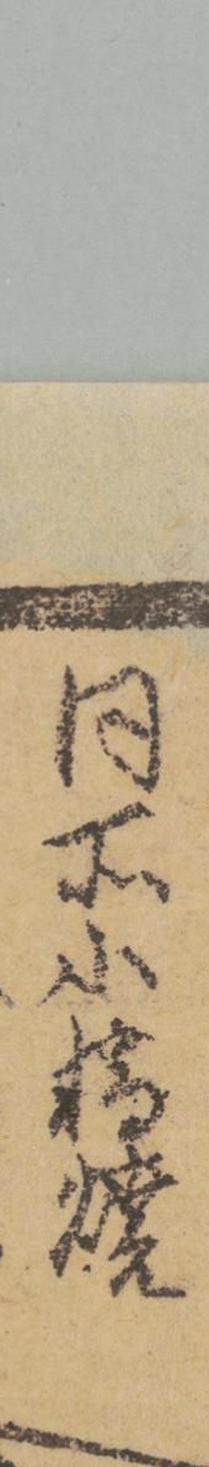同所小橋焼
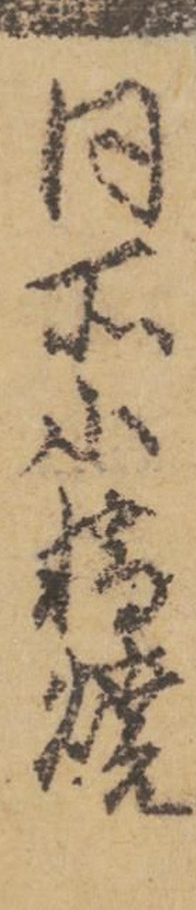同所小橋焼
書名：[安政元年十二月の江戸大火に関する瓦版]
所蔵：東京大学地震研究所図書室 Earthquake Research Institute Library, The University of Tokyo, JAPAN
